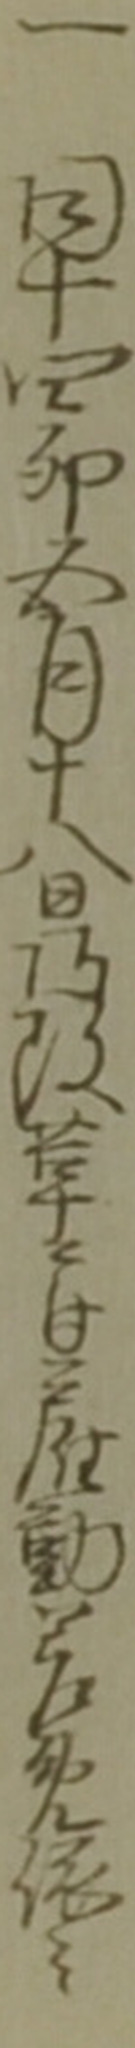一同十四卯五月十八日御改革ニ付雇勤差免依之
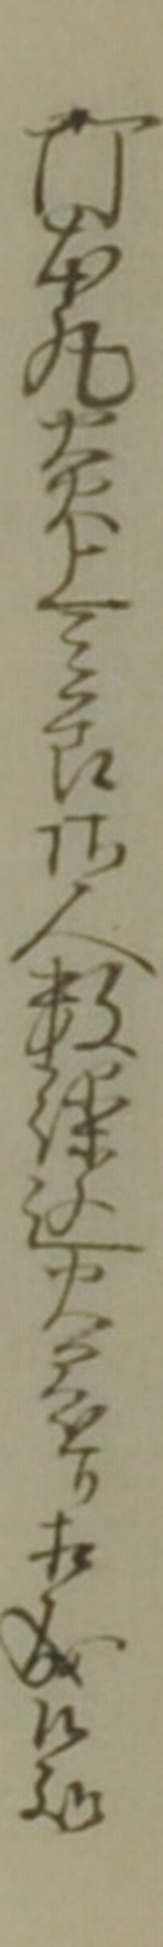御本丸炎上之節御人数繰込火懸リ相成候処
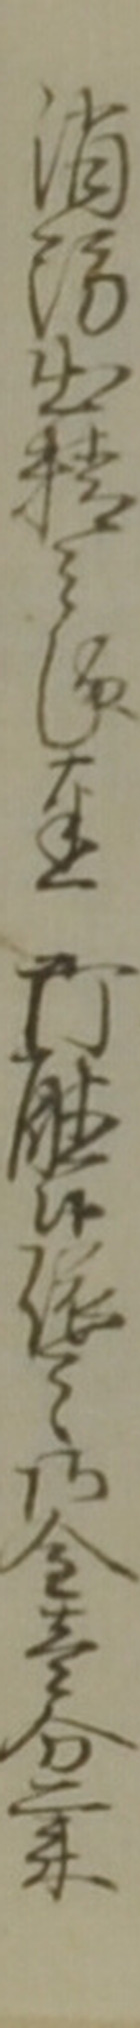消防出精之趣達御聴候依之御金壱分二朱
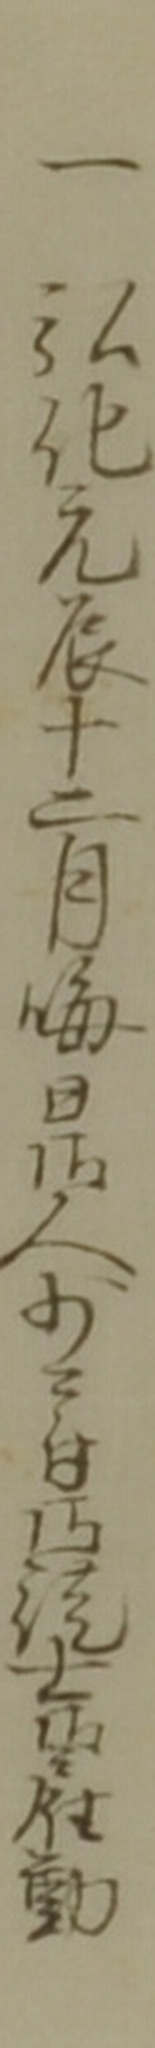一弘化元辰十二月晦日御人少ニ付御徒士御雇勤
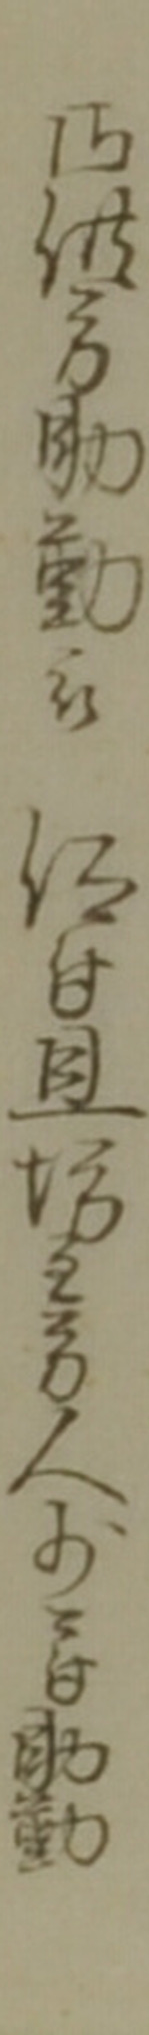御供方助勤被仰付且坊主人少ニ付助勤
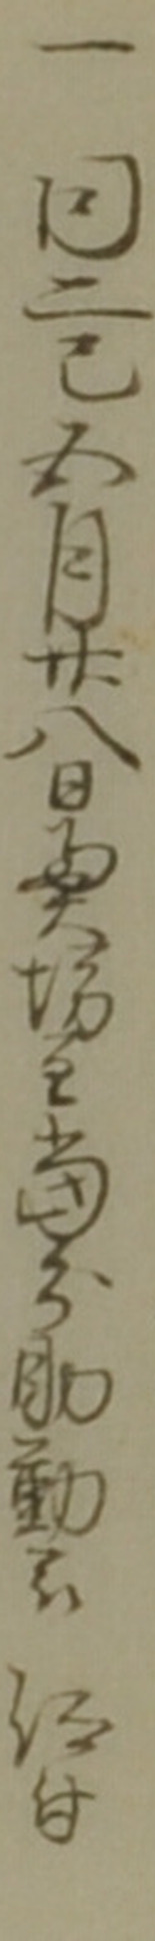一同二巳五月廿八日奥坊主当分助勤被仰付
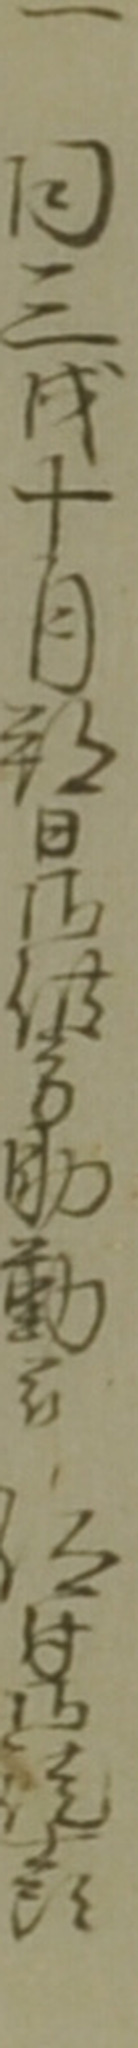一同三戌十月朔日御供方助勤被仰付御徒士頭
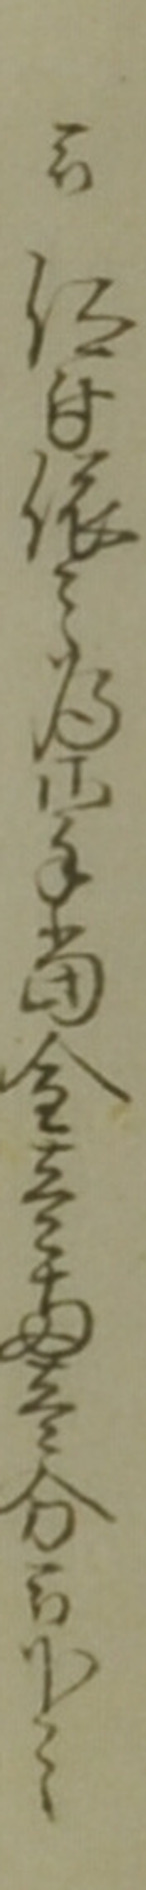被仰付依之為御手当金壱両壱分被下之
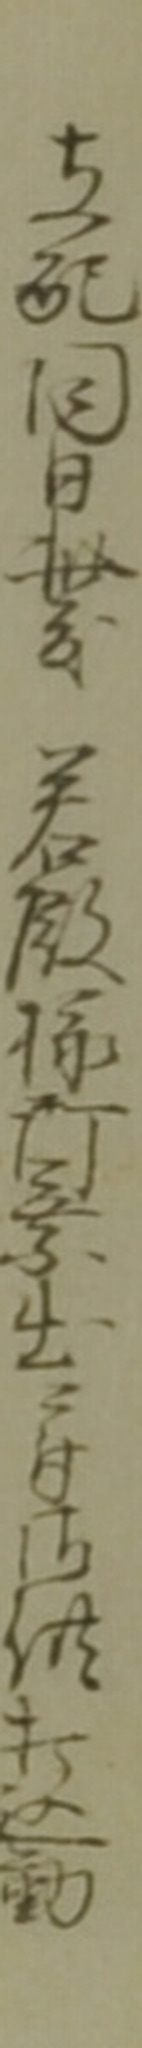支配同日此度若殿様御乗出ニ付御供打込勤
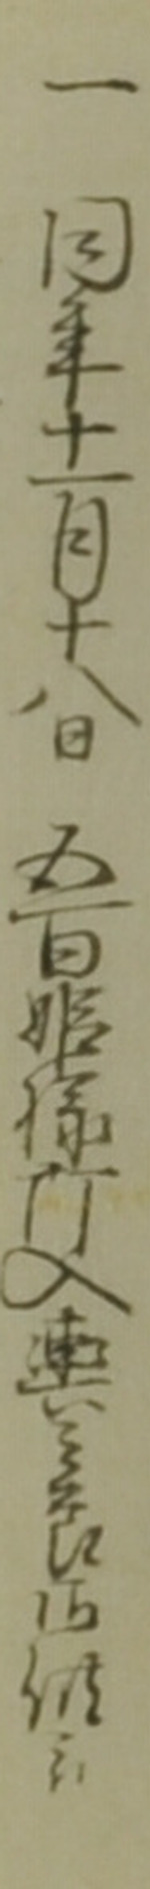一同年十一月十八日五百姫様御入輿之節御供被
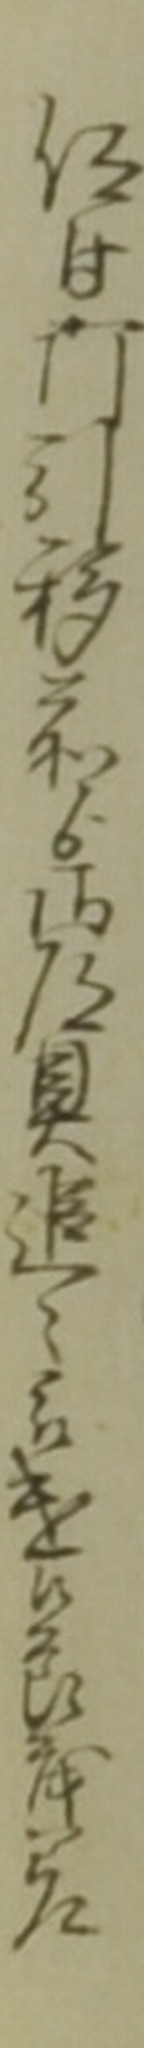仰付御引移前ゟ御道具追々被遣候節茂差

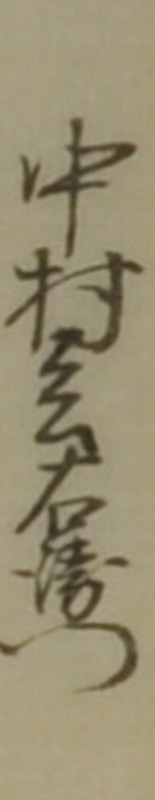中村左五右衛門

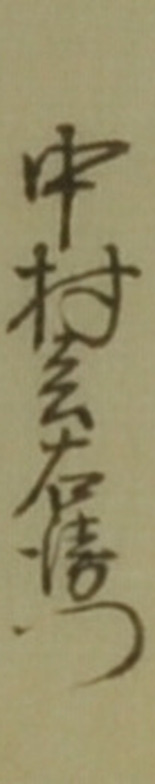中村玄右衛門
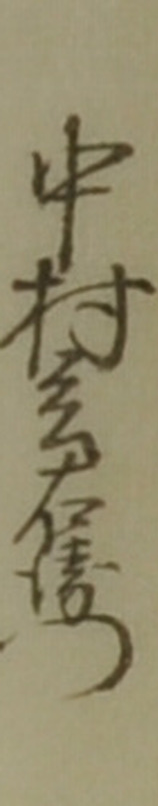中村玄右衛門

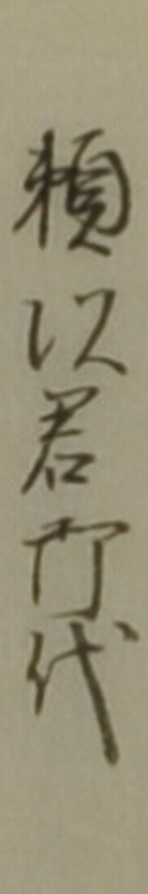頼以君御代
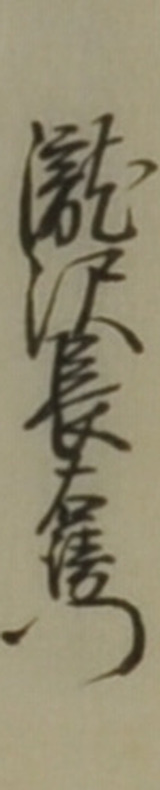瀧沢長右衛門
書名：無足諸士勤仕録（七）
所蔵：伊那市立高遠町図書館・合同会社AMANE
